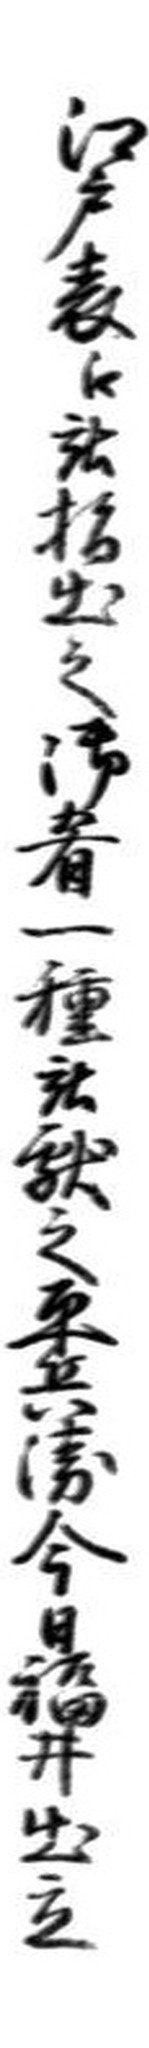江戸表江被指出之御肴一種被献之平兵衛今日福井出立
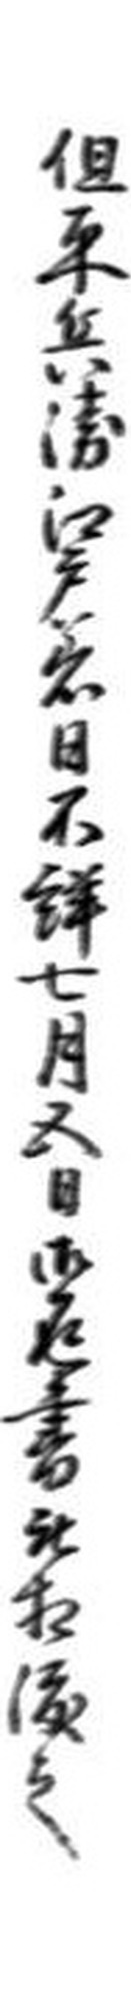但平兵衛江戸着日不詳七月五日御返書被相渡之
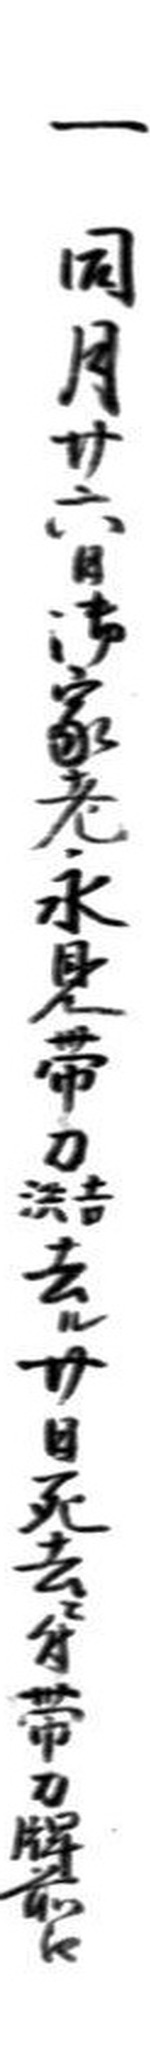一同月廿六日御家老永見帯刀吉洪去ル廿日死去ニ付帯刀牌前江
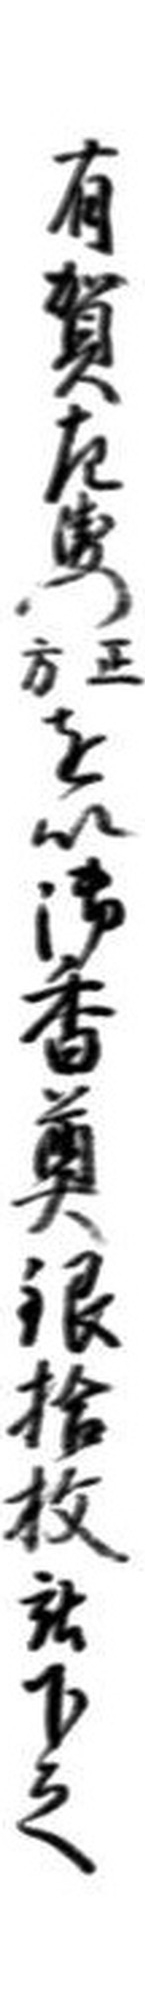有賀左衛門正方を以御香奠銀拾枚被下之
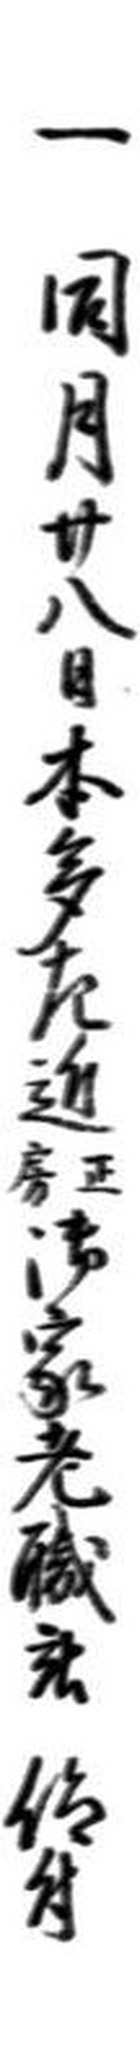一同月廿八日本多左近正房御家老職被仰付

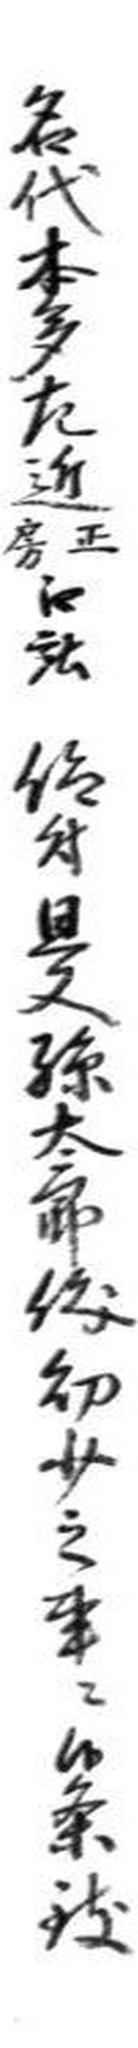名代本多左近正房江被仰付且又孫太郎儀幼少之事ニ候条致
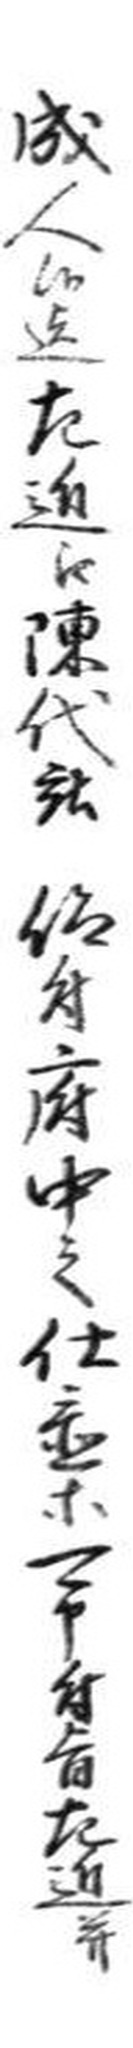成人候迄左近江陳代被仰付府中之仕置等可申付旨左近并
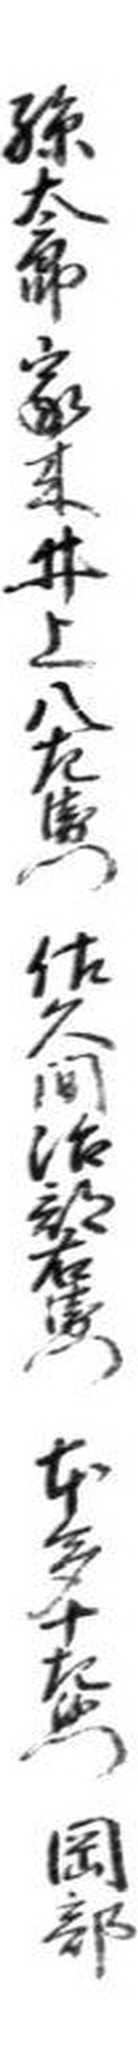孫太郎家来井上八左衛門佐久間治部右衛門本多十左衛門岡部
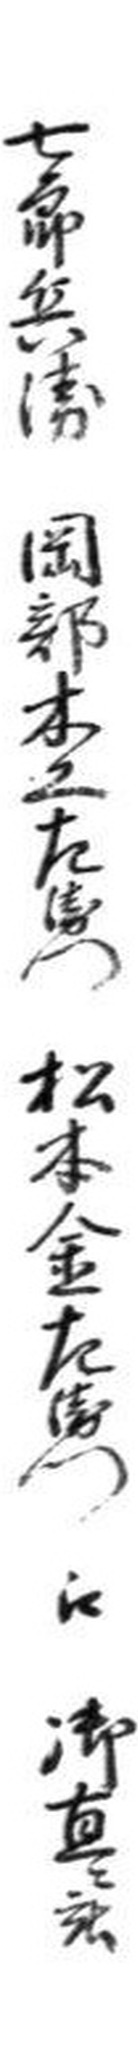七郎兵衛岡部木工左衛門松本金左衛門江御直ニ被
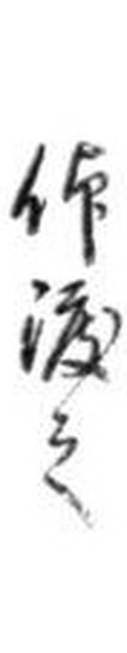仰渡之
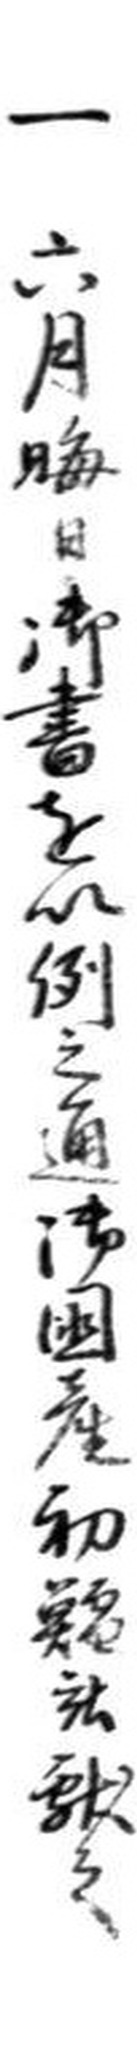一六月晦日御書を以例之通御国産初鱈被献之
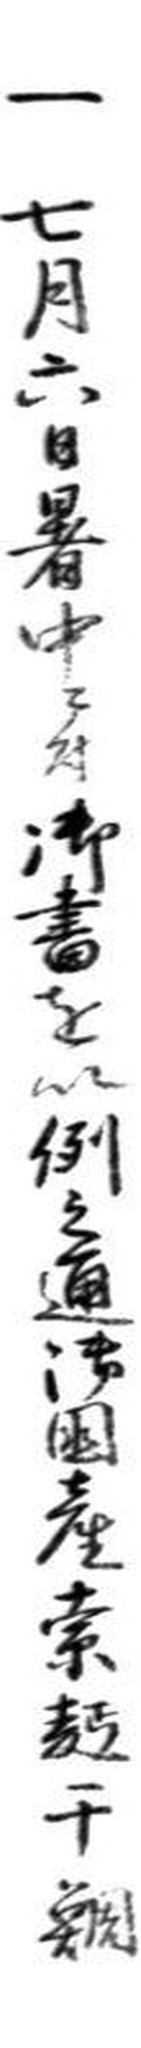一七月六日暑中ニ付御書を以例之通御国産索麺干鯛
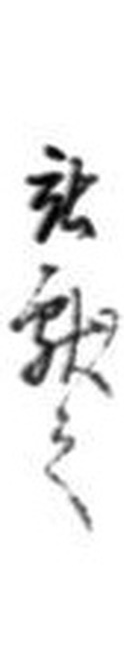被献之
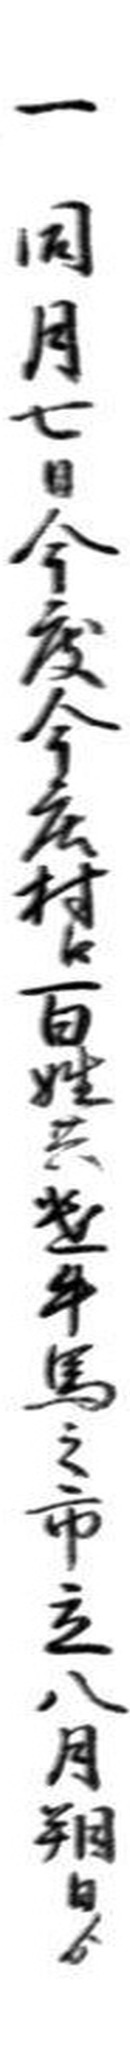一同月七日今度今庄村江百姓共遣牛馬之市立八月朔日ゟ
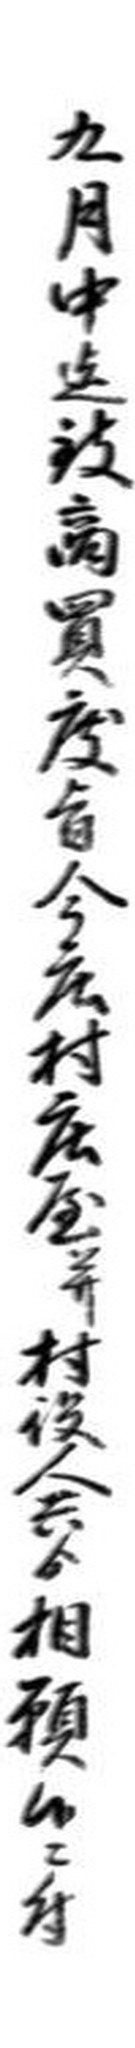九月中迄致商買度旨今庄村庄屋并村役人共ゟ相願候ニ付
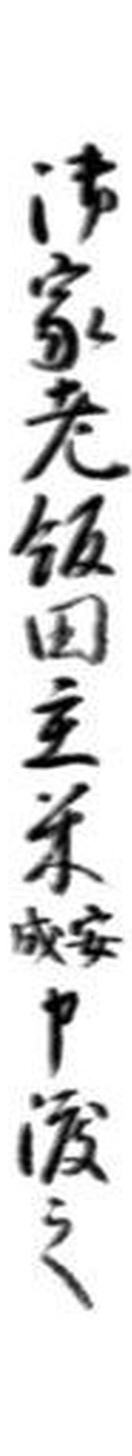御家老飯田主米安成申渡之
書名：家譜 七 光通公 従寛文四年到同九年
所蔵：福井県文書館 Fukui Prefectural Archives
